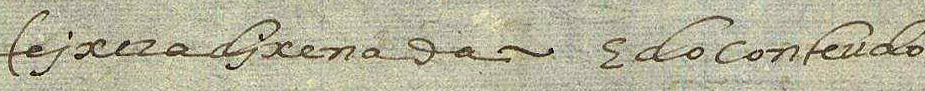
tejxera djxe nada ~ e do conteudo
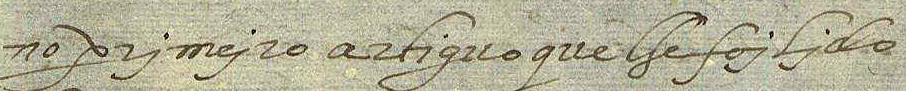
no prjmejro artiguo que lhe foj ljdo
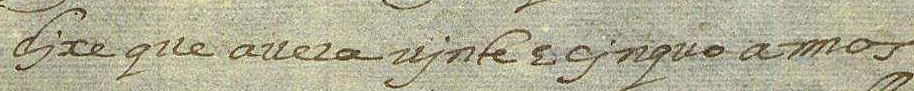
dixe que auera ujnte E cjnquo annos
